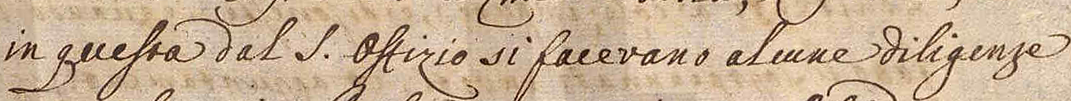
in questa dal S. offizio si facevano alcune diligenze
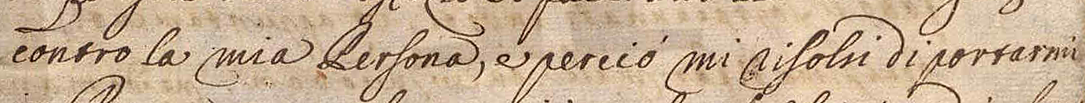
contro la mia Persona, e perció mi risolsi di portarmi
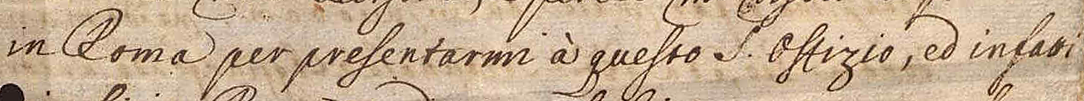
in Roma per presentarmi à questo S. Offizio, ed in fatti
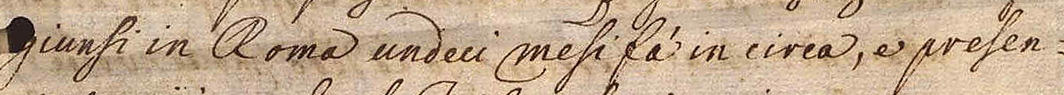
giunsi in Roma undeci mesi fá in circa, e presen
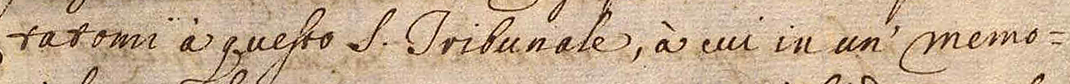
tatomi à questo S. Tribunale, à cui in un' memo
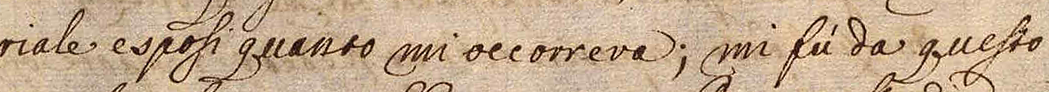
riale esposi quanto mi occorreva; mi fú da questo
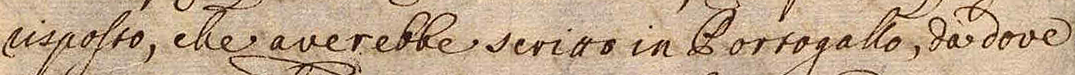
risposto, che averebbe scritto in Portogallo, da dove
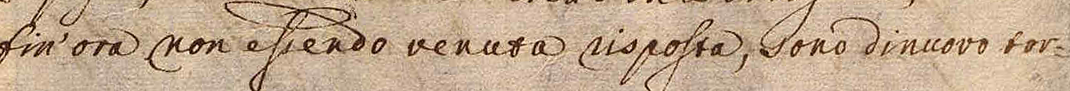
fin'ora non essendo venuta risposta, sono dinuovo tor
